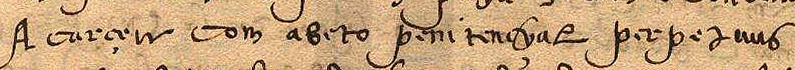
A carcere com abeto penitencyal perpetuus
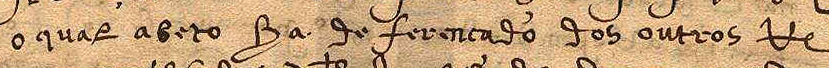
o qual abeto ꞩa deferençado dos outros Re
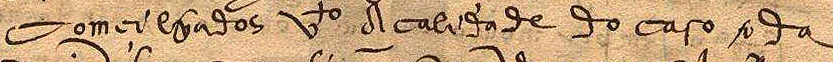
Comcilyados Vto A calidade do caso e da
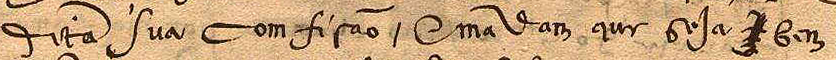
dita Sua Comfisão / e mādam que seJa _ bem
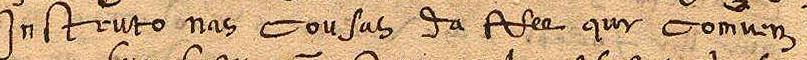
Jnstruto nas Cousas da fee que comuem
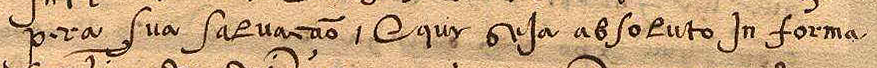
pera Sua Saluação / e que seJa absoLuto Jn forma
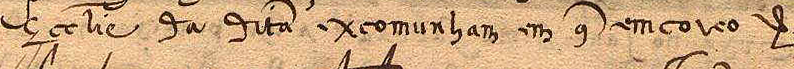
Ecc̄lie da dīta excomunham em q̄ emcoreo
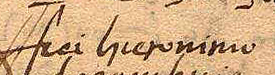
frei hieronimo
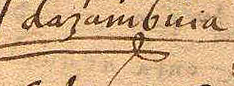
dazambuia
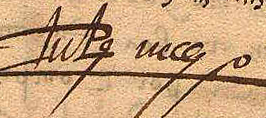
ĪuLꝯ uelho
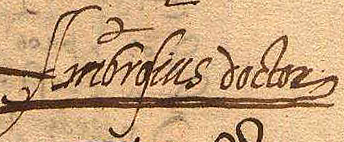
Ambrosius doctor
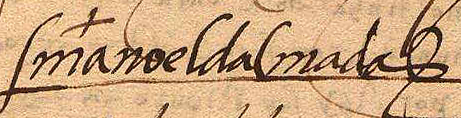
manoel dalmada
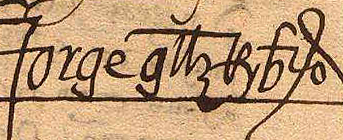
Jorge ḡllz Rybro
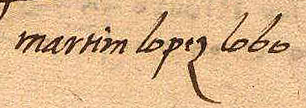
martim lopez lobo
